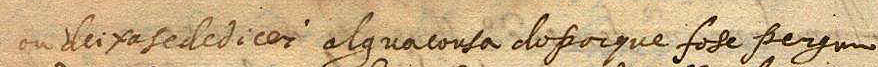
ou deixase de dicer algua cousa do porque fose pergun
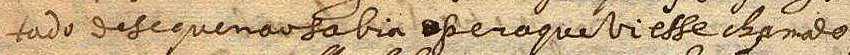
tado dise que nao sabia o pera que viesse chamado
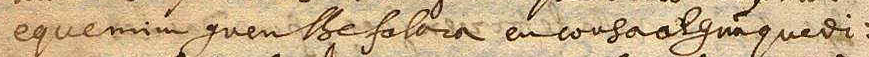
e que nimguem lhe falara em cousa alguā que di
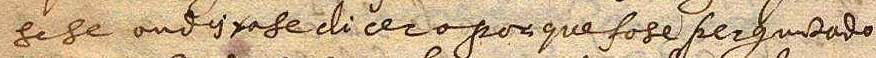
sese ou dejxase dicer o porque fose perguntado
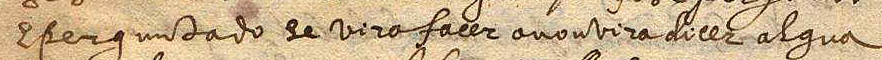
E perguntado se vira facer ou ouvira dicer algua
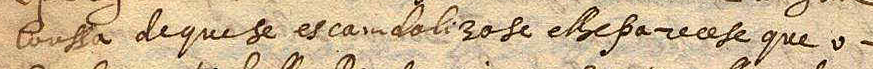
coussa de que se escamdalizase e lhe parecese que o
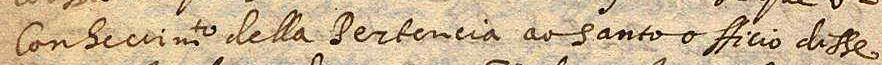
conhecimto della Pertencia ao santo officio disse
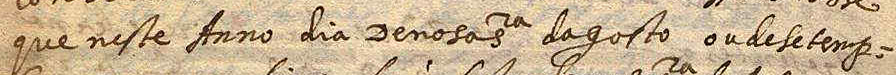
que neste Anno dia De nosa sra dagosto ou de setemp
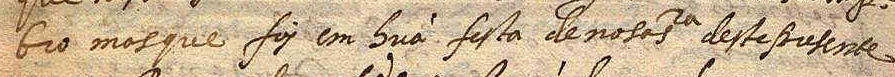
bro mas que foj em huā festa de nosa sra deste presente
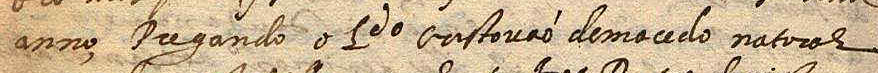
anno, Pregando o Ldo cristouaõ de macedo natural
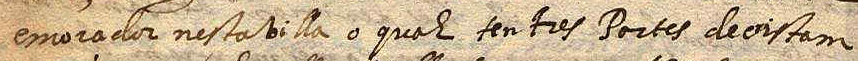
e morador nesta villa o qual ten tres Partes de cristam
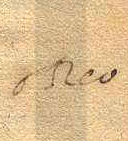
o Reo
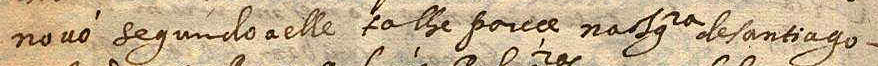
nouo segundo a elle ta lhe parece na Igra de santiago
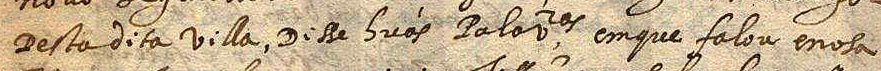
Desta dita villa, Disse huās Palavras em que falou e nosa
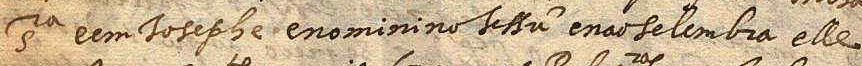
sra e em Iosephe e no minino Iessu e nao se lembra elle
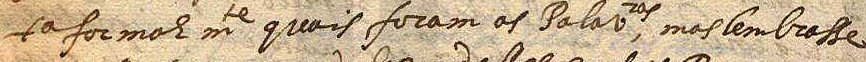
ta formalmte quais foram as Palavras, mas lembrasse
